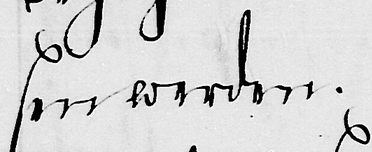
sen werden.
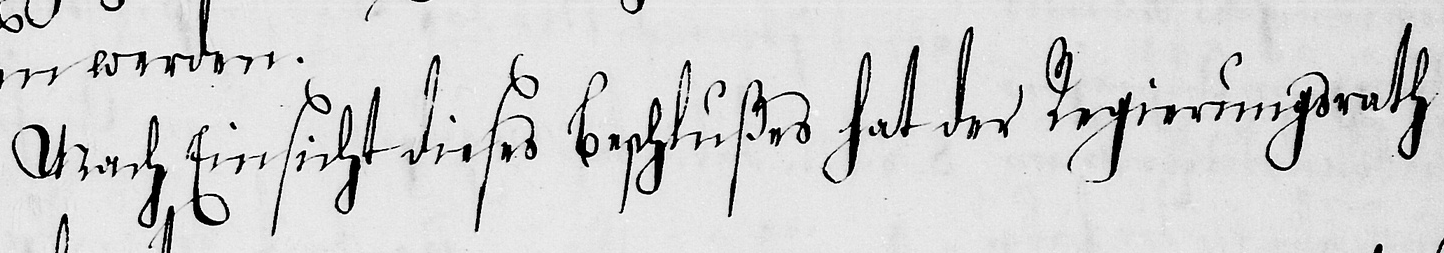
Nach Einsicht dieses Beschlußes hat der Regierungsrath
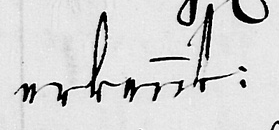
erkannt:
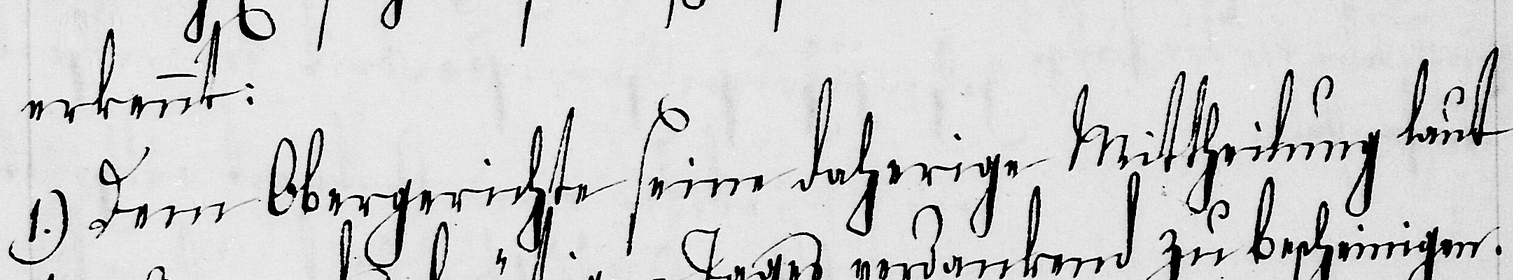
1.) Dem Obergerichte seine daherige Mittheilung laut
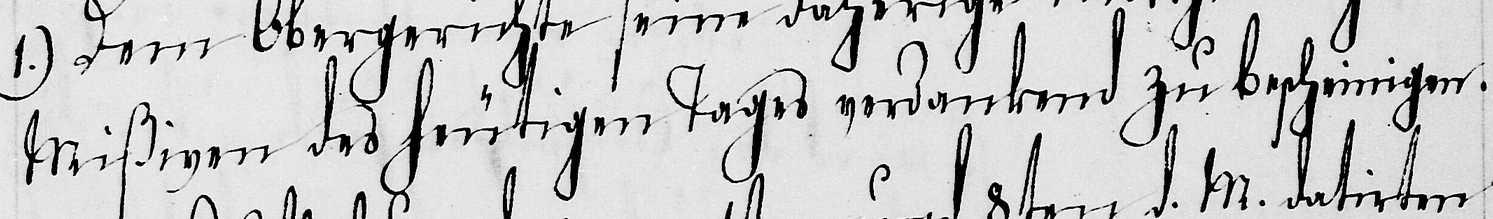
Mißiven des heutigen Tages verdankend zu bescheinigen.
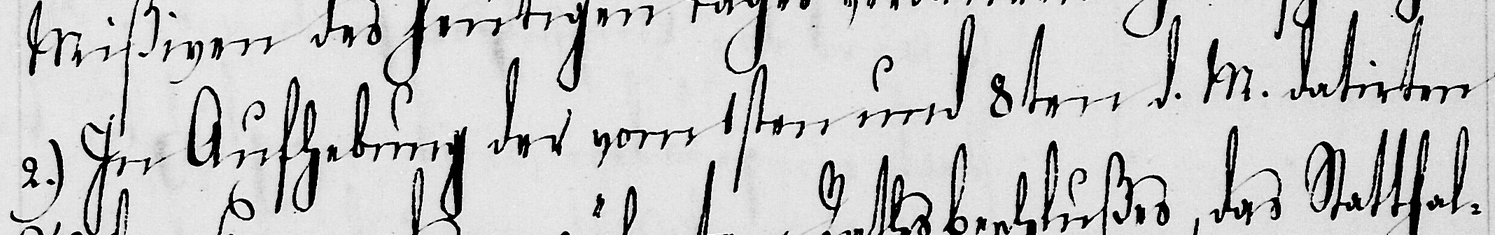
2.) In Aufhebung der vom 1sten und 8ten d. M. datirten
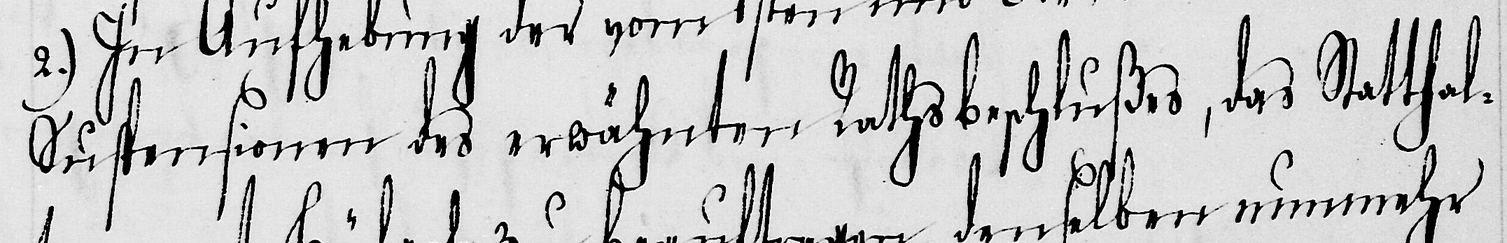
Suspensionen des erwähnten Rathsbeschlußes, das Statthal¬
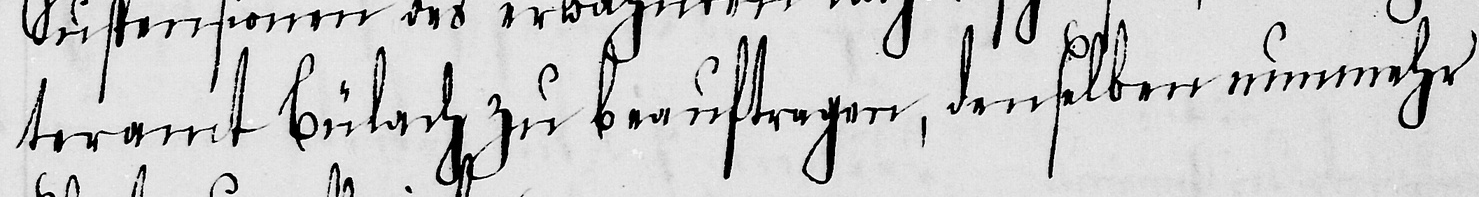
teramt Bülach zu beauftragen, denselben nunmehr
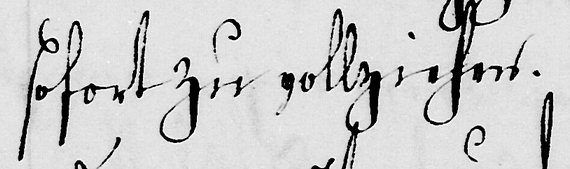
sofort zu vollziehen.
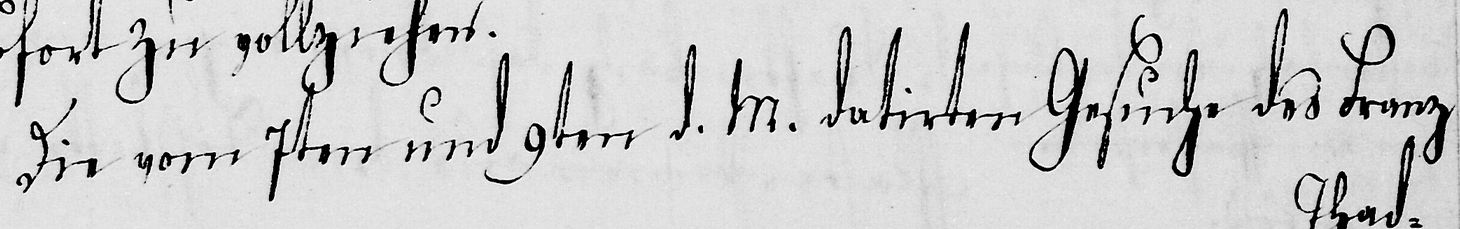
Die vom 7ten und 9ten d. M. datirten Gesuche des Franz
